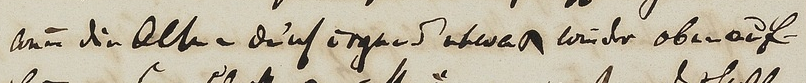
wenn die Alten durch irgend etwas wieder obenauf-
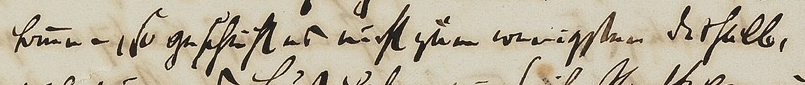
kommen, so geschieht es nicht zum wenigsten deshalb,
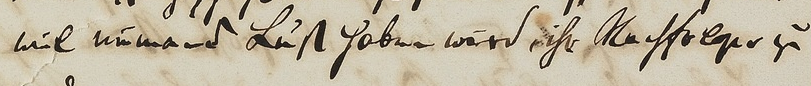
weil niemand Lust haben wird ihr Nachfolger zu
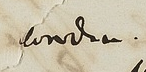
werden.
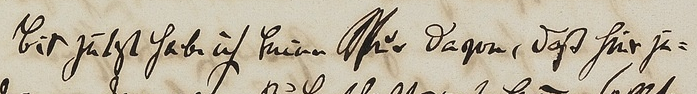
Bis jetzt habe ich keine Spur davon, daß hier je-
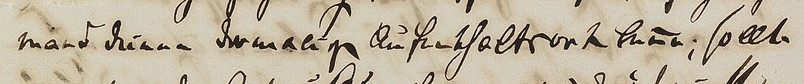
mand deinen dermaligen Aufenthaltsort kenne, sollte
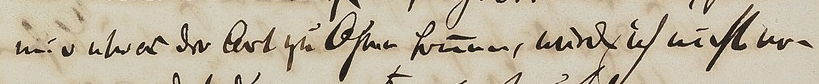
mir etwas der Art zu Ohren kommen, würde ich nicht er-
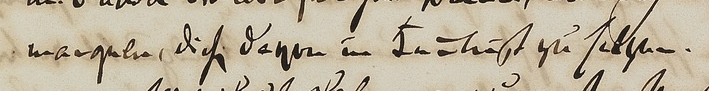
mangeln, dich davon in Kenntniß zu setzen.
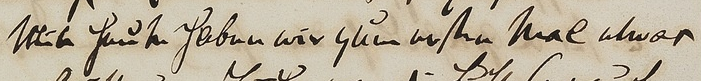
Mit heute haben wir zum ersten Mal etwas
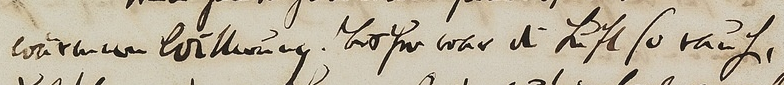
wärmere Witterung. Bisher war die Luft so rauh,
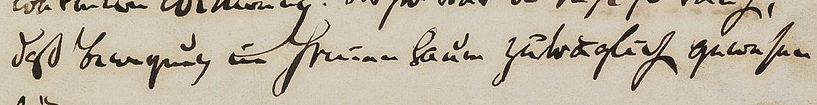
daß Bewegung im Freien kaum zuträglich gewesen
